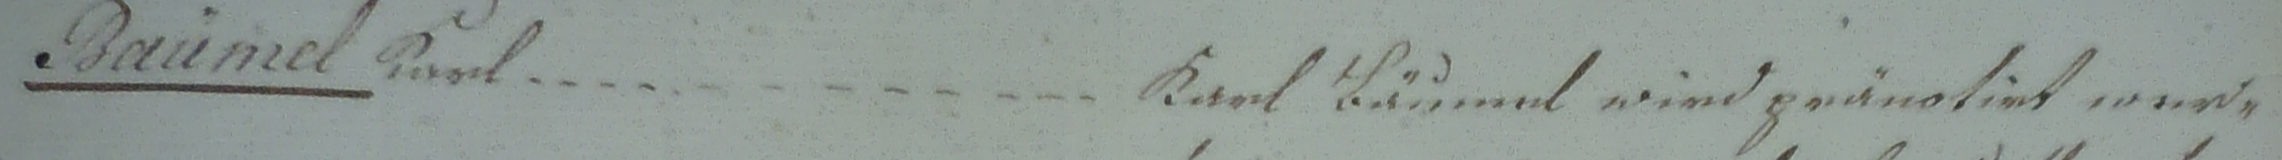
Bäumel Karl ………… Karl Bäumel wird pränotirt wer¬
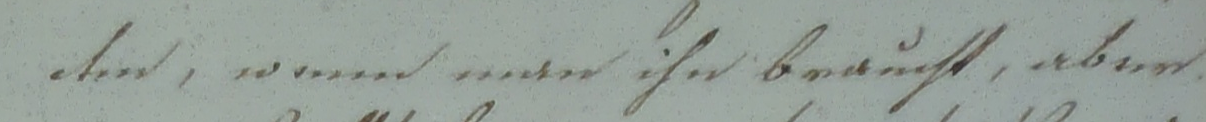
den, wenn man ihn braucht, aber
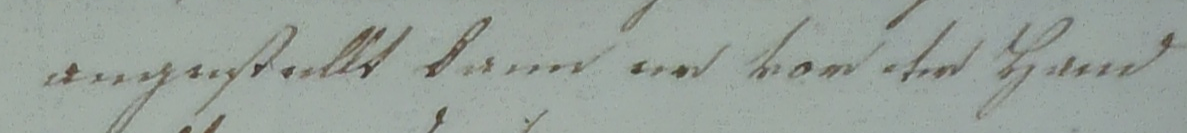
angestellt kann er vor der Hand
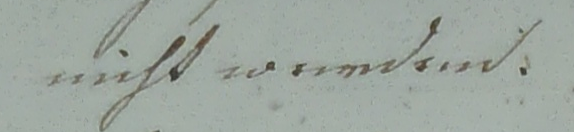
nicht werden.
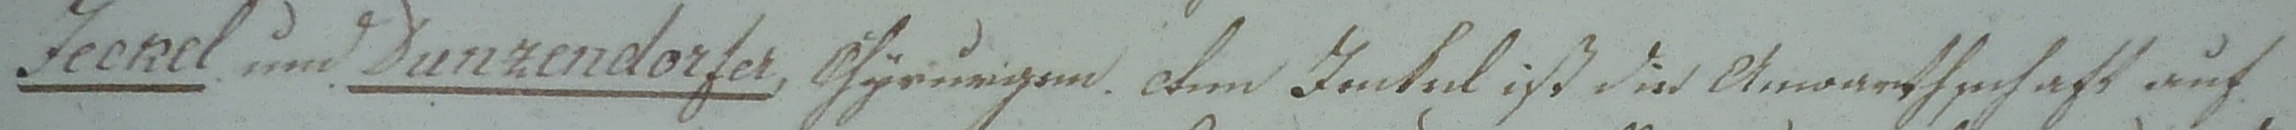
Jeckel und Dunzendorfer. Chyrurgen. Dem Jeckel ist die Anwartschaft auf
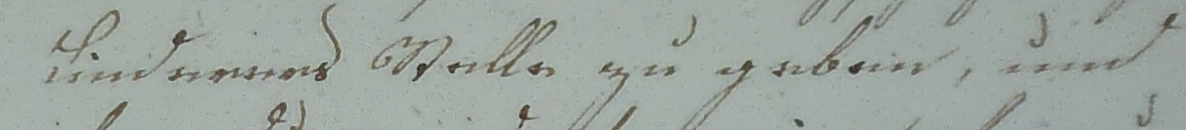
Linderers Stelle zu geben, und
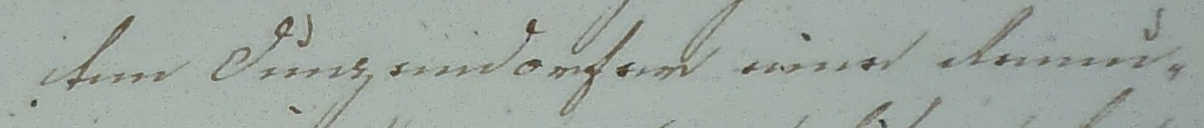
dem Dunzendorfer eine Remun¬
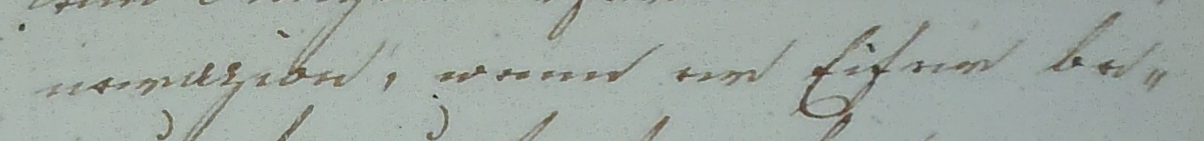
nerazion, wenn er Eifer be¬
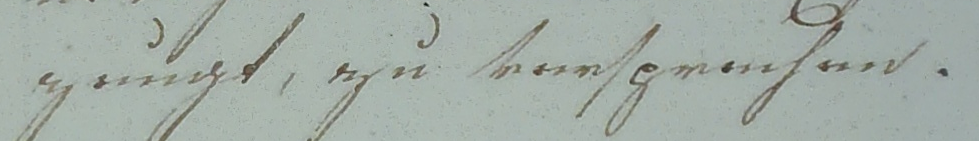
zeugt, zu versprechen.
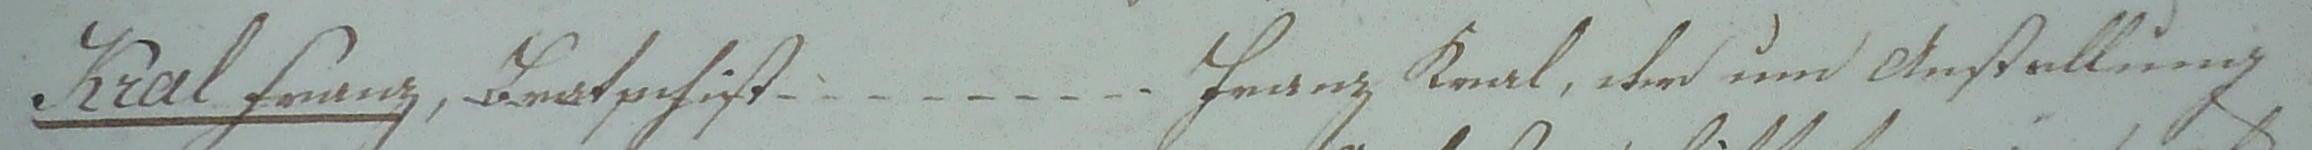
Kral Franz, Bratschist ……… Franz Kral, der um Anstellung
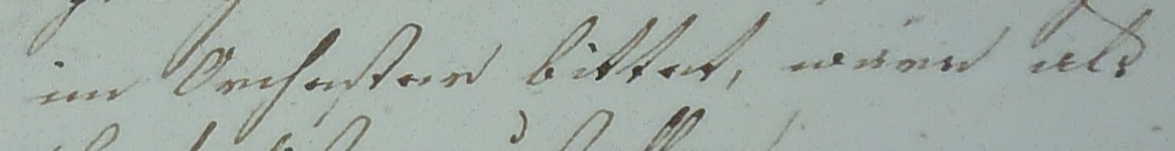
im Orchester bittet, wäre als
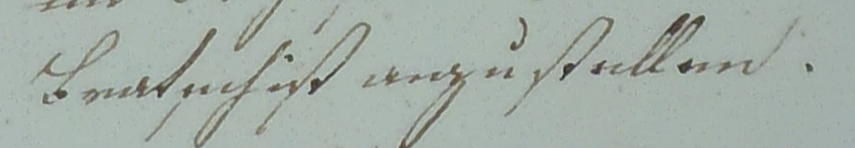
Bratschist anzustellen.
